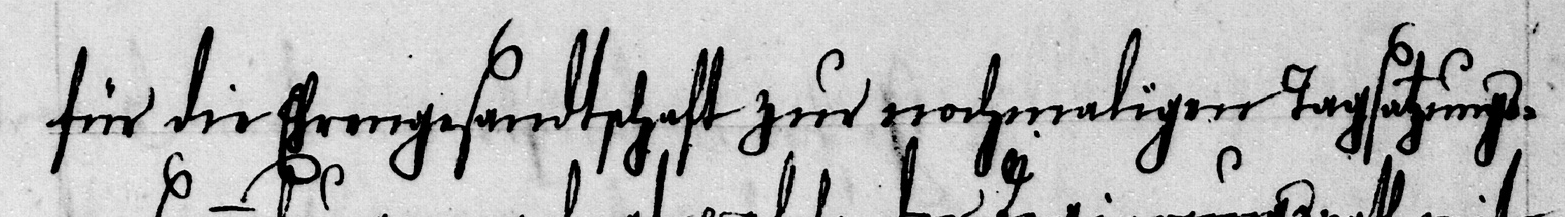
für die Ehrengesandtschaft zur nochmaligen Tagsatzung¬
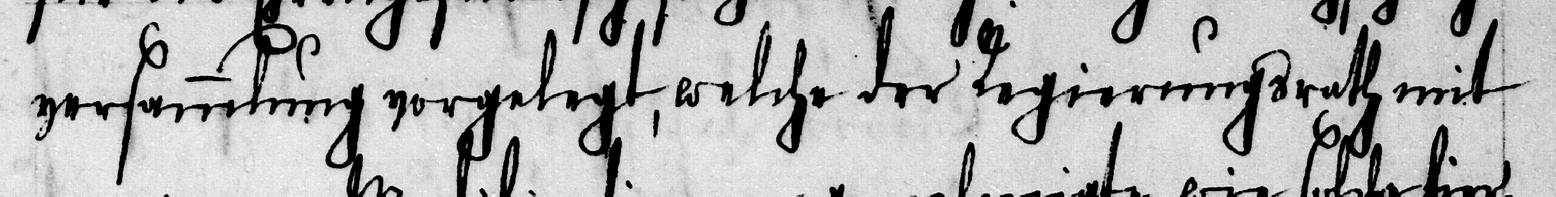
sversammlung vorgelegt, welche der Regierungsrath mit
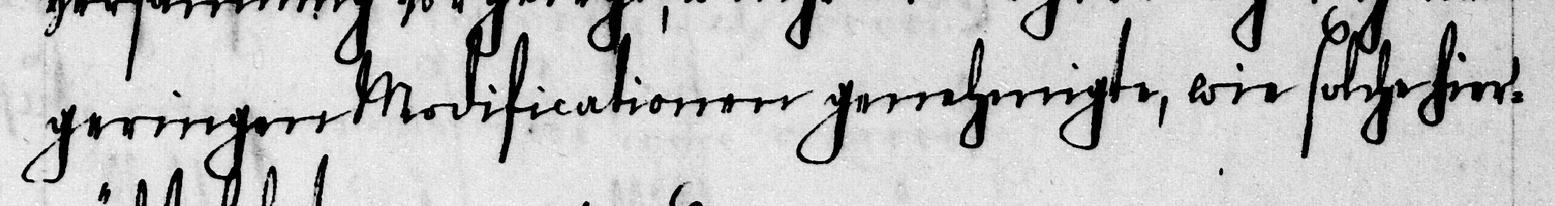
geringen Modificationen genehmigte, wie solche hier¬
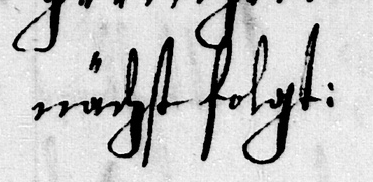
nächst folgt:
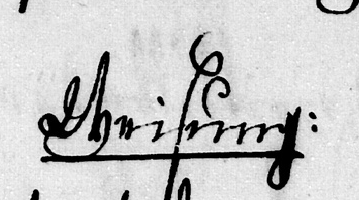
Weisung:
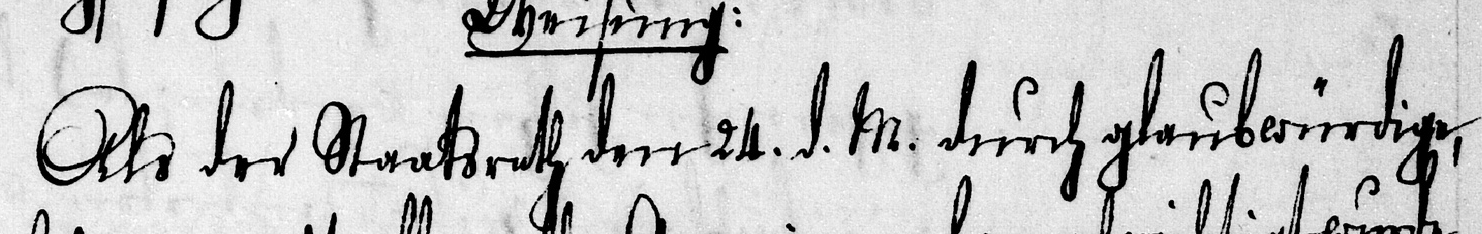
Als der Staatsrath den 24. d. M. durch glaubwürdige,
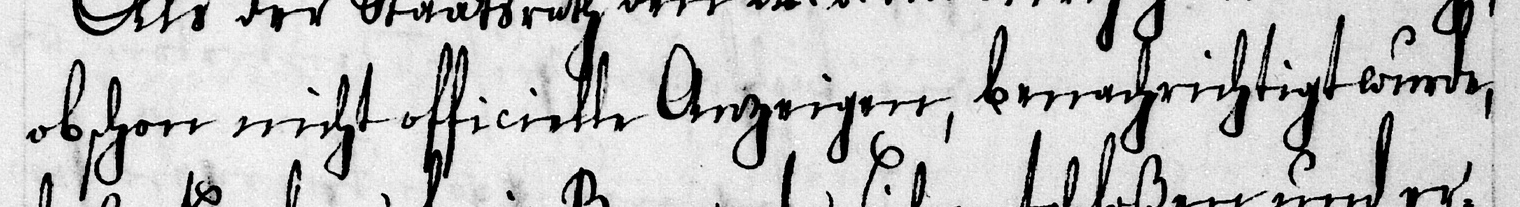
obschon nicht officielle Anzeigen, benachrichtigt wurde,
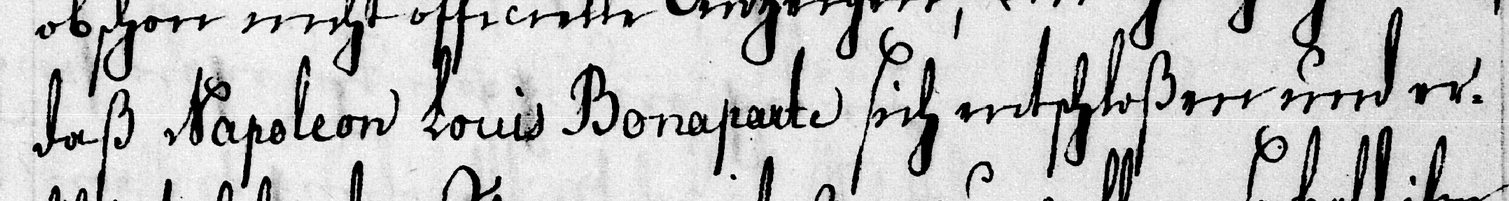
daß Napoleon Louis Bonaparte sich entschloßen und er¬
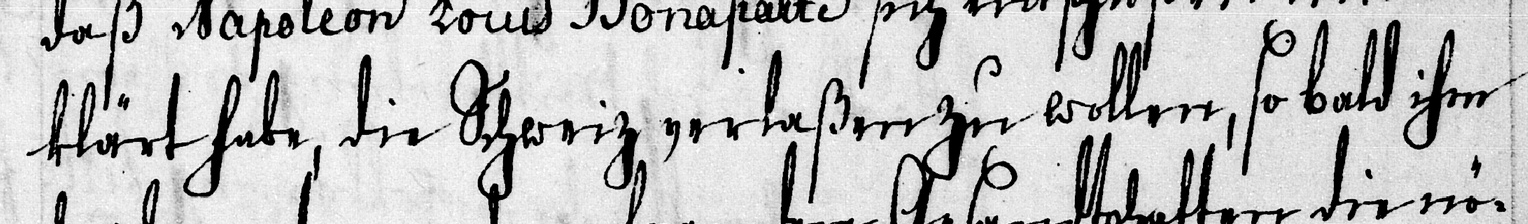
klärt habe, die Schweiz verlaßen zu wollen, so bald ihm
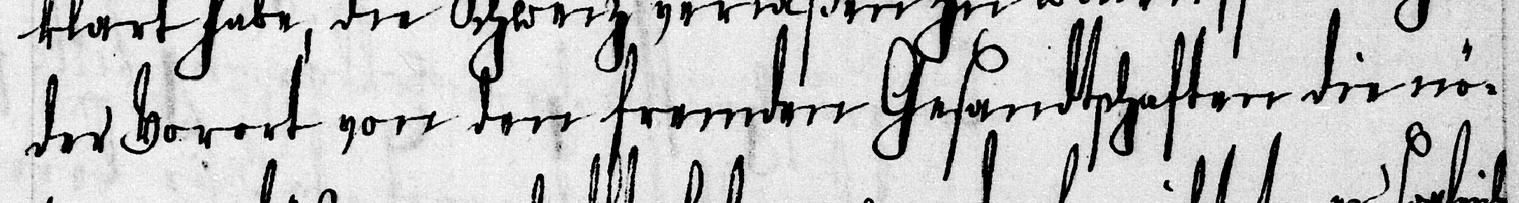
der Vorort von den fremden Gesandtschaften die nö¬
